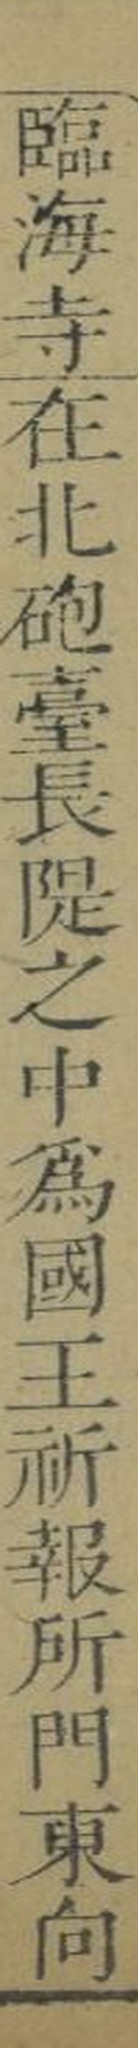[臨海寺]在北砲台長隄之中為国王祈報所門東向
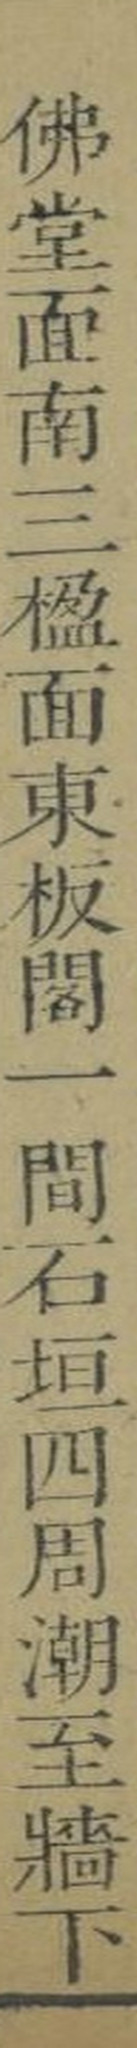仏堂面南三楹面東板閣一間石垣四周潮至牆下
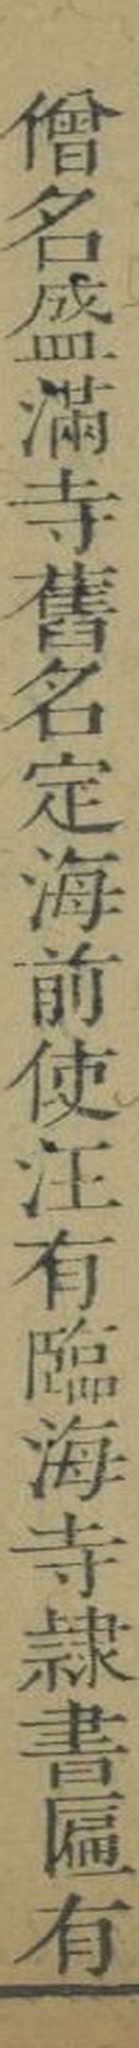僧名盛満寺旧名定海前使汪有臨海寺隷書匾有
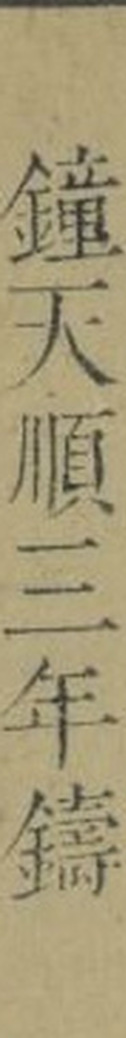鐘天順三年鋳
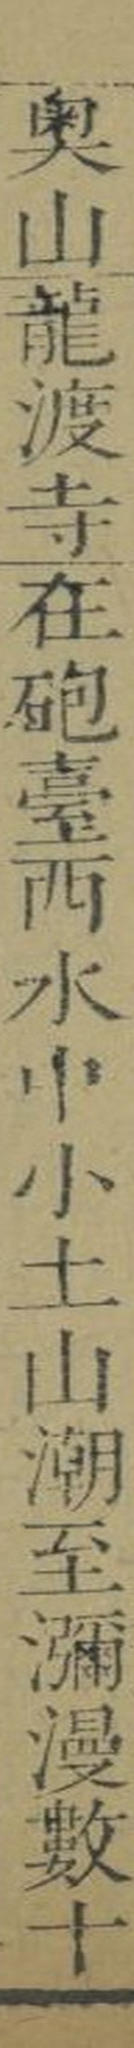[奥山][竜渡寺]在砲台西水中小土山潮至瀰漫数十
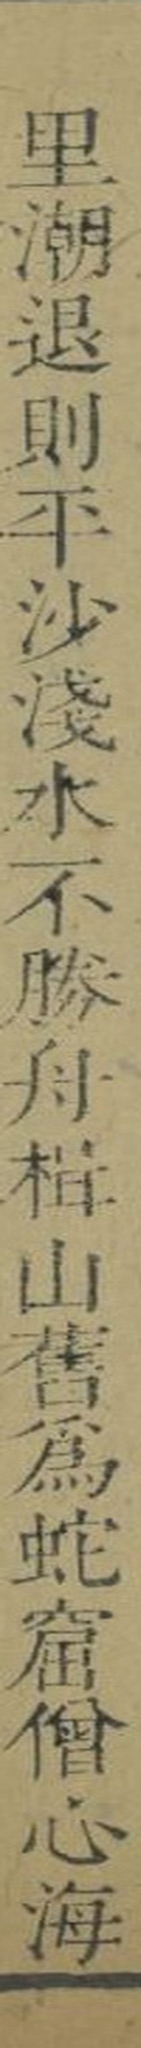里潮退則平沙浅水不勝舟楫山旧為蛇窟僧心海
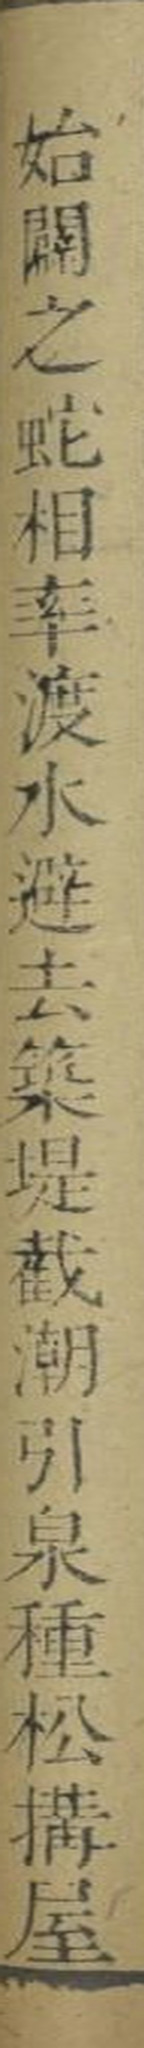始闢之蛇相率渡水避去築堤截潮引泉種松搆屋
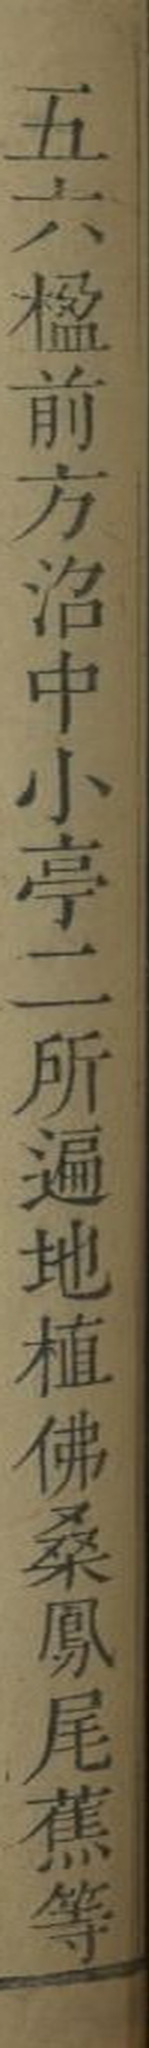五六楹前方沼中小亭二所遍地植仏桑鳳尾蕉等
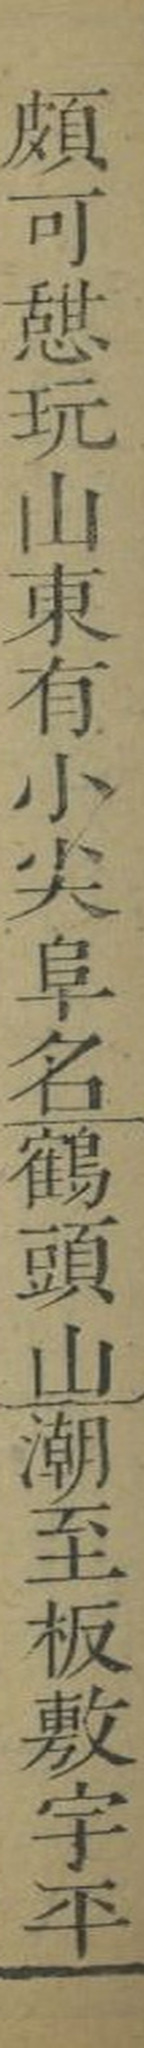頗可憩玩山東有小尖阜名[鶴頭山]潮至板敷宇平
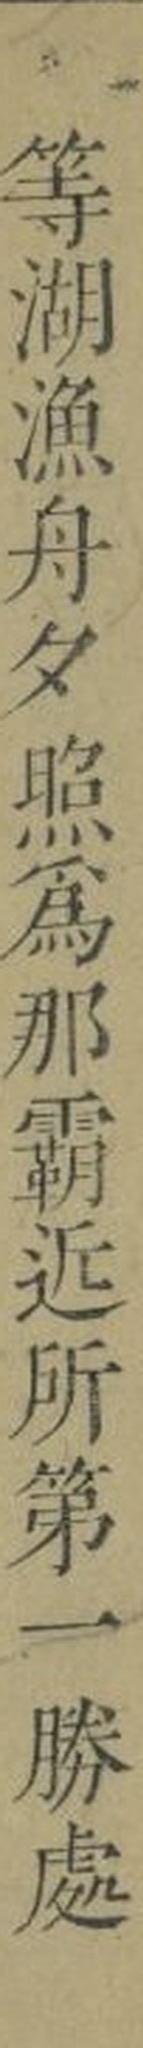等湖漁舟夕照為那覇近所第一勝処
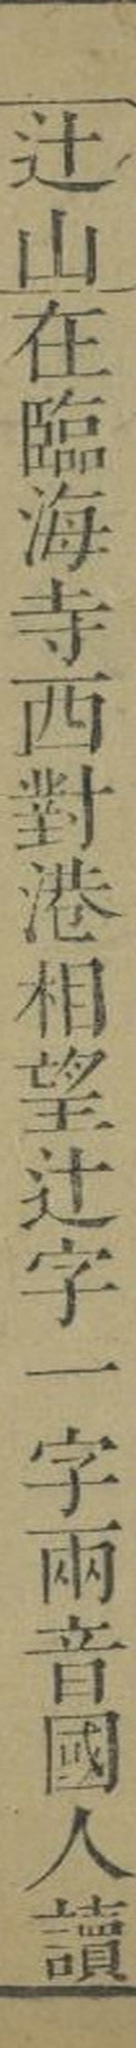[辻山]在臨海寺西対港相望辻字一字両音国人読
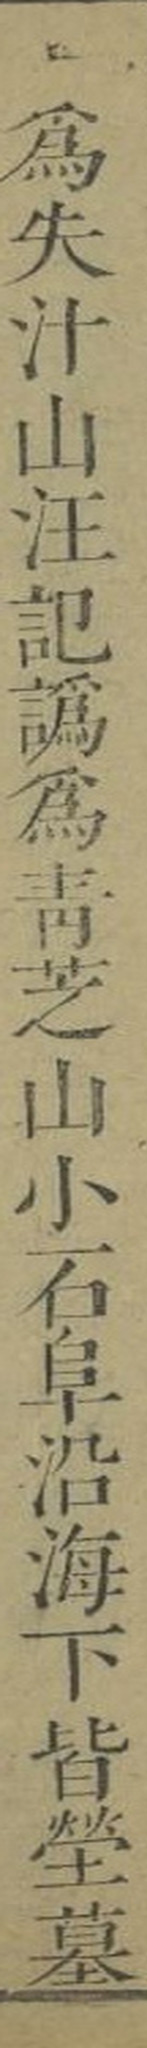為失汁山汪記譌為青芝山小石阜沿海下皆塋墓
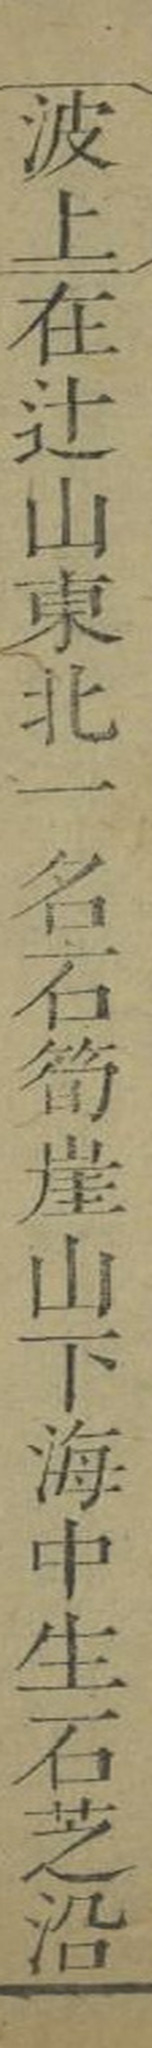[波上]在辻山東北一名石筍崖山下海中生石芝沿
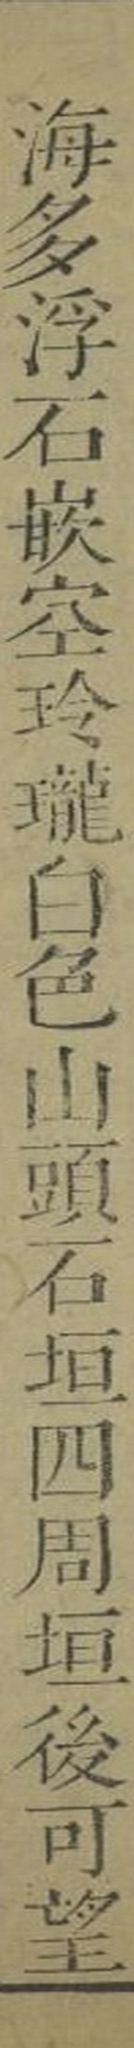海多浮石嵌空玲瓏白色山頭石垣四周垣後可望
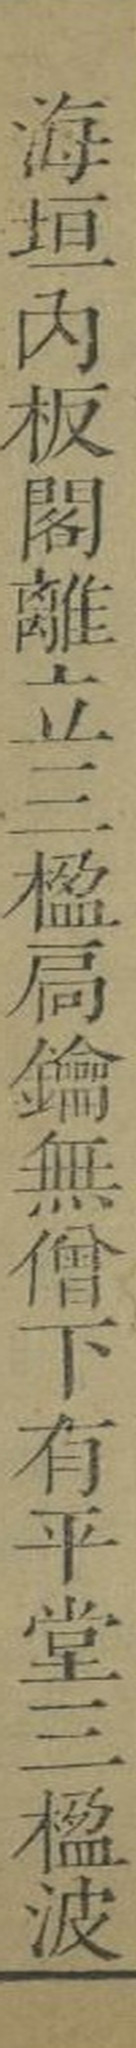海垣内板閣離立三楹扃鑰無僧下有平堂三楹波

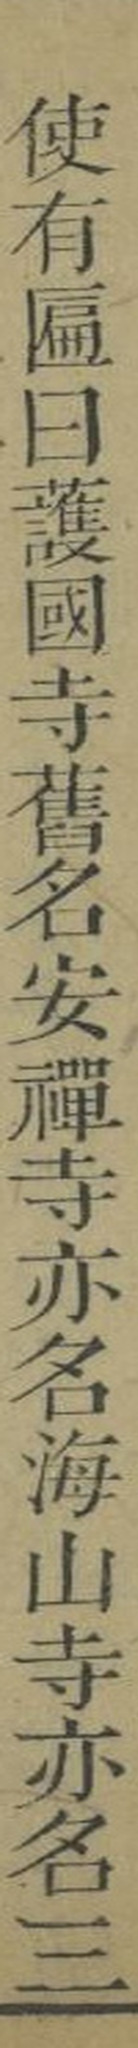使有匾曰護国寺旧名安禅寺亦名海山寺亦名三
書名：中山伝信録 巻四
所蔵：University of the Ryukyus Library
